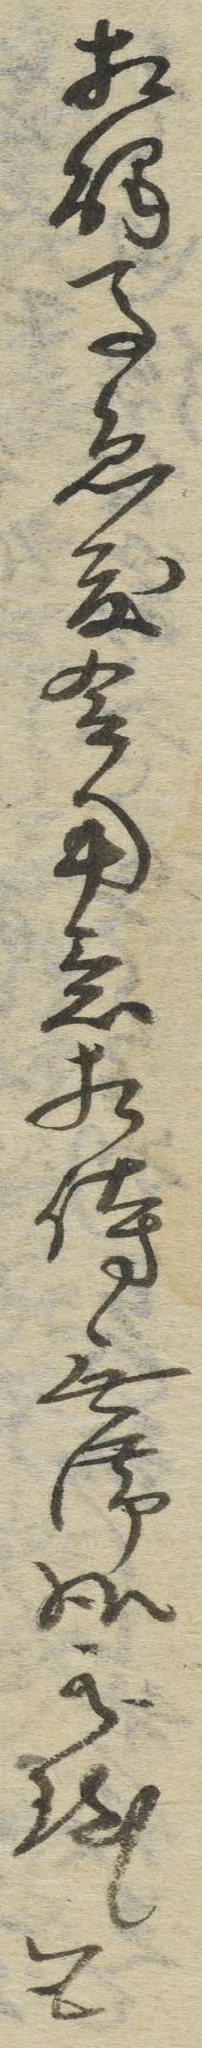相触馬急度今日用意相待候無滞様可被致候以上
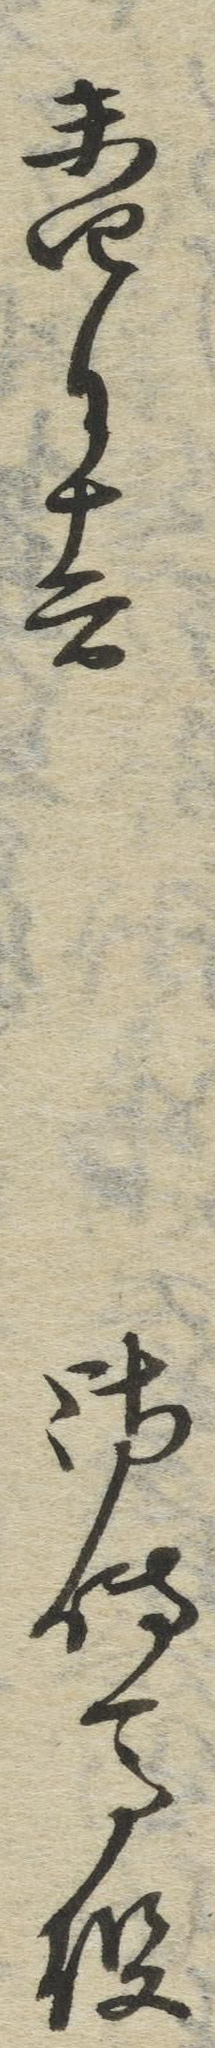未四月十二日御伝馬役
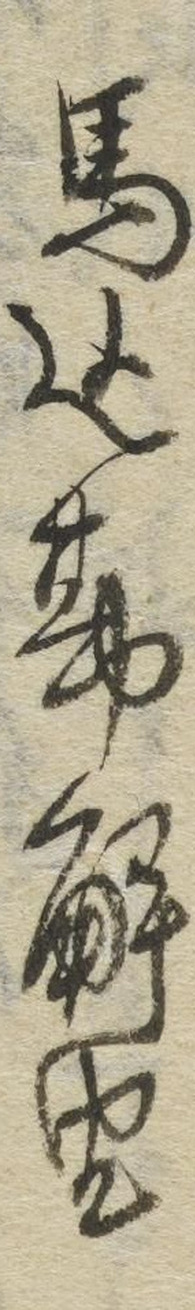馬込勘解由
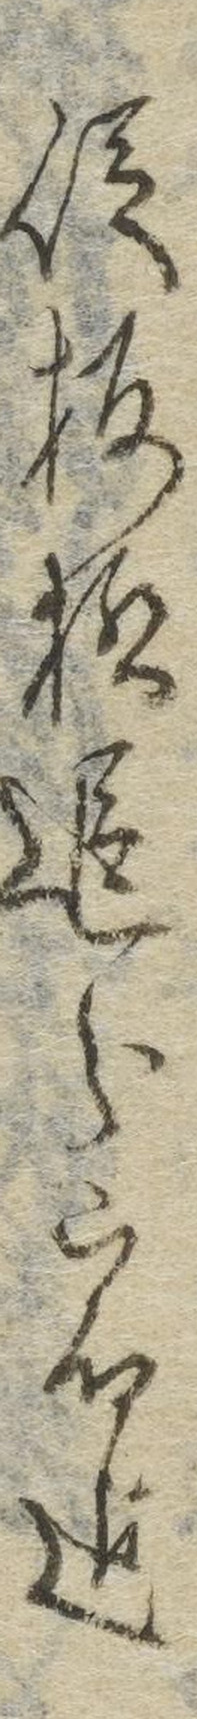従板橋追分宿迄
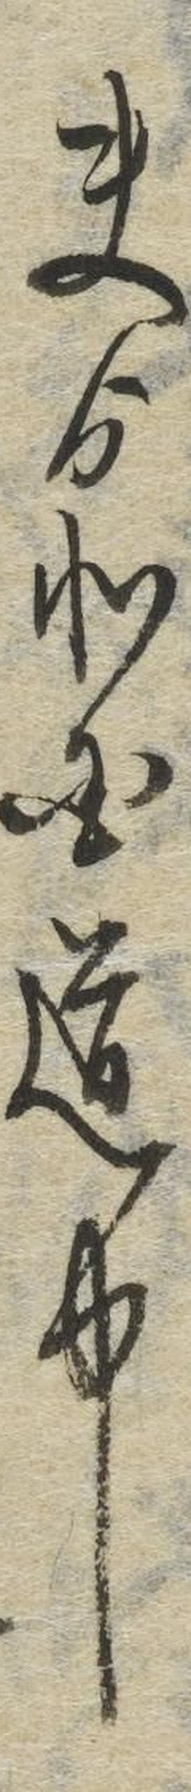夫ゟ北国道中
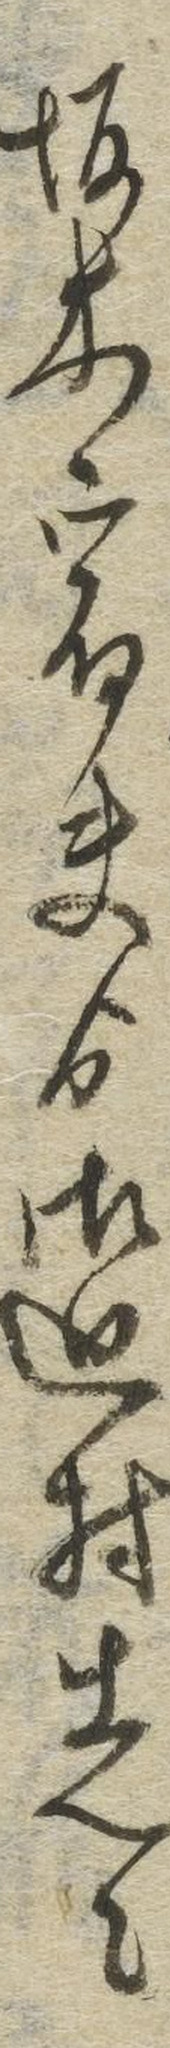坂木宿夫ゟ御廻村先々
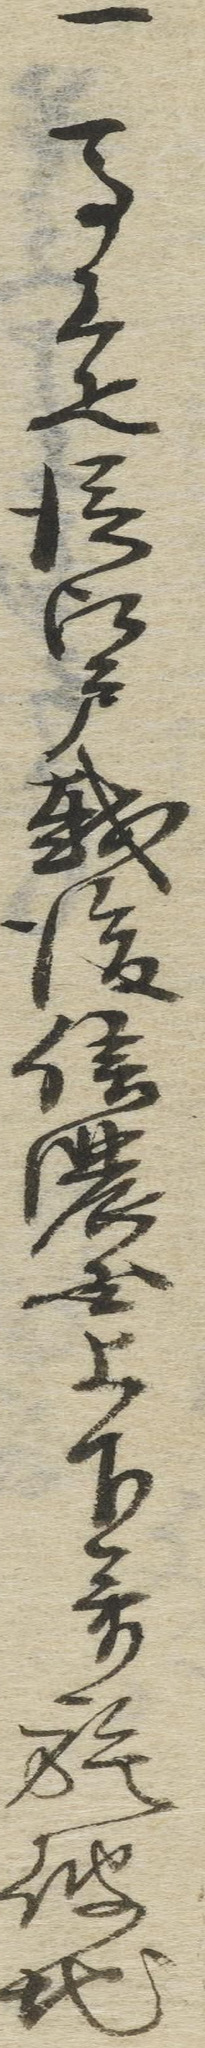一馬壱疋従江戸越後信濃国上下旁於彼地
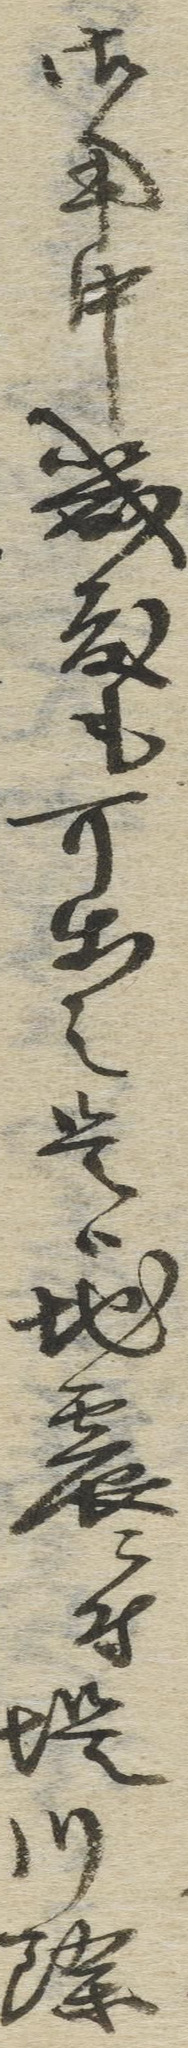御用中幾度も可出候是ハ地震二付堤川除
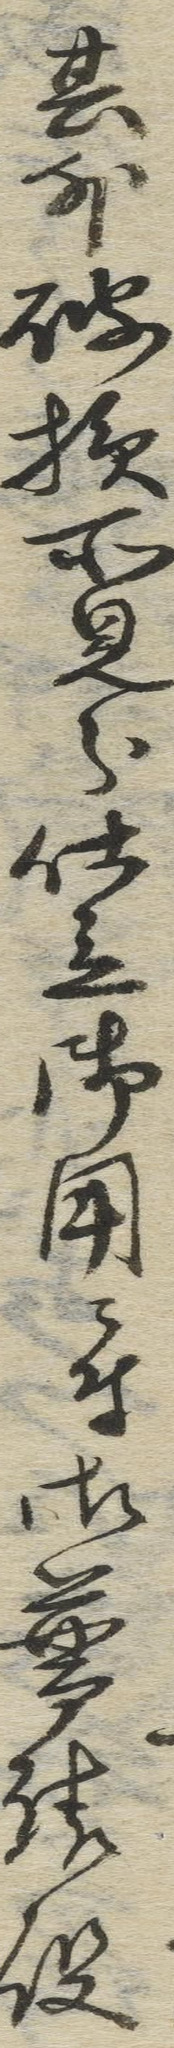其外破損所見分仕立御用二付御普請役
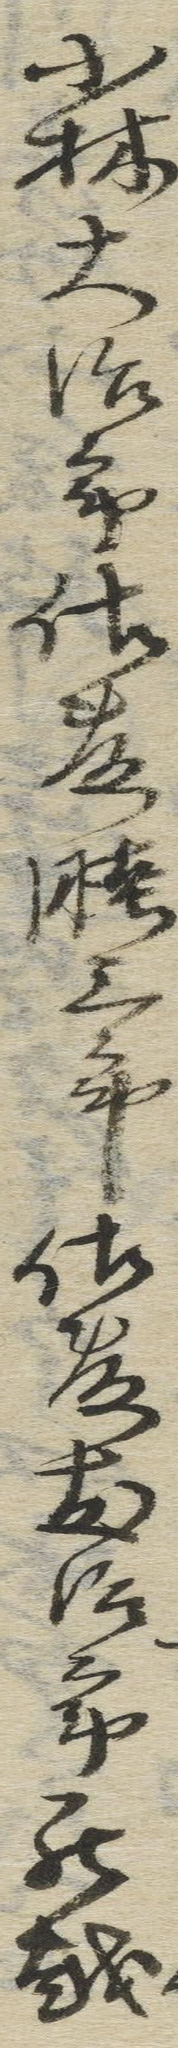小林大治郎佐藤睦三郎佐藤友治郎罷越
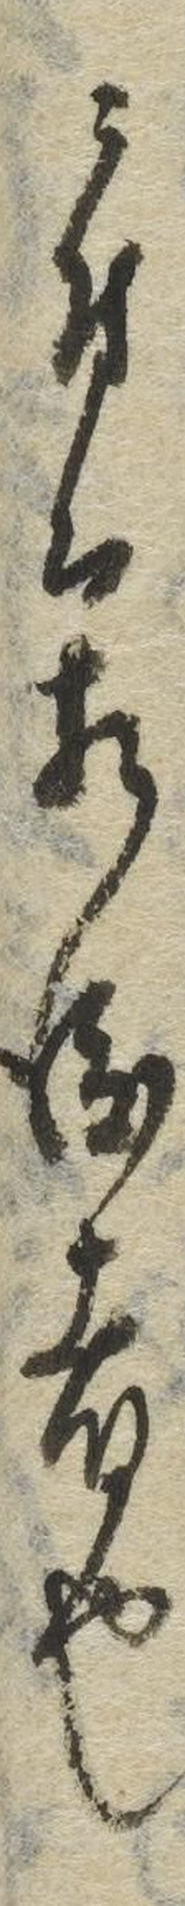二付而相渡者也
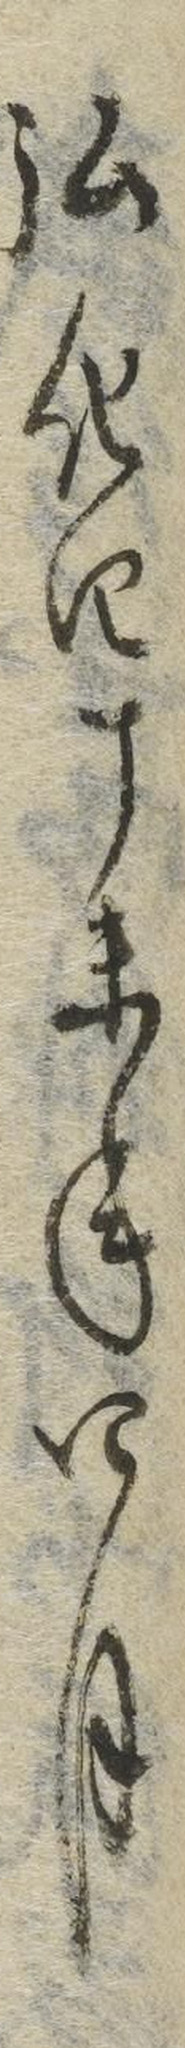弘化四丁未年四月
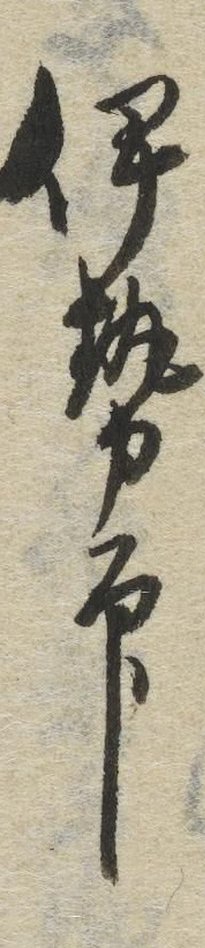伊勢守印
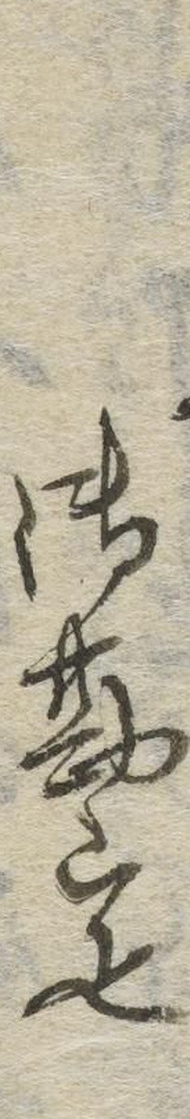御勘定
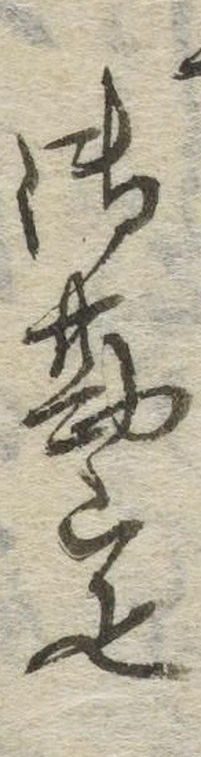御勘定
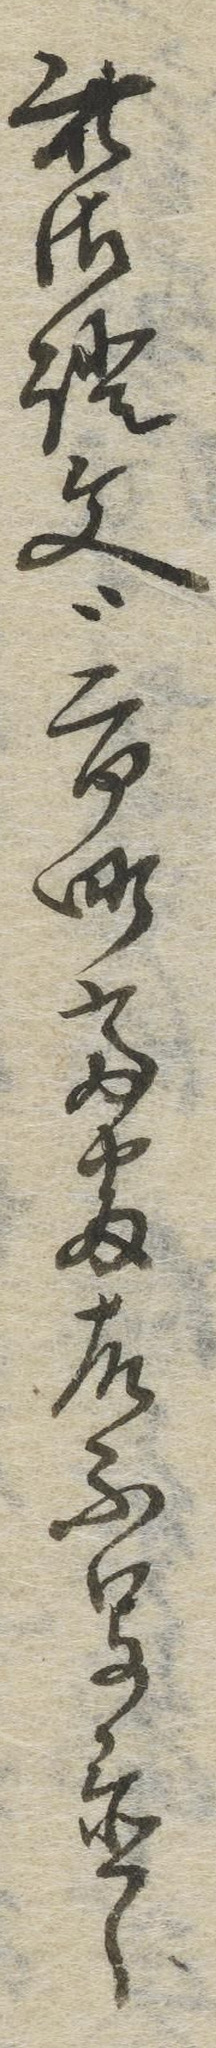此御證文は市町当番故不写置候
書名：信濃越後　地震書留
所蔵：東京大学地震研究所図書室 Earthquake Research Institute Library, The University of Tokyo, JAPAN
